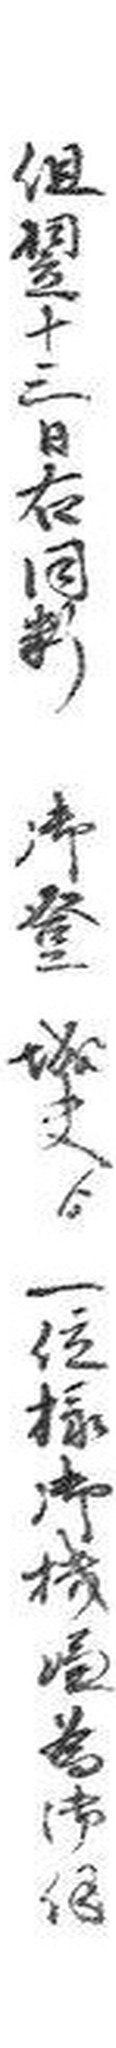但翌十三日右同断御登城ゟ一位様御機嫌為御伺
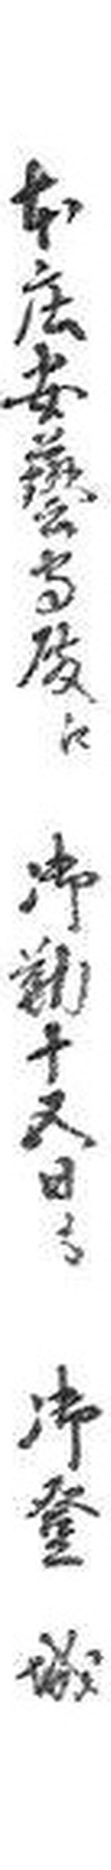本庄安芸守殿江御勤十五日も御登城
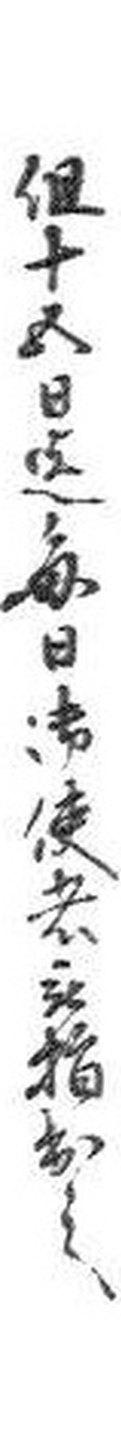但十五日迄毎日御使者被指出之
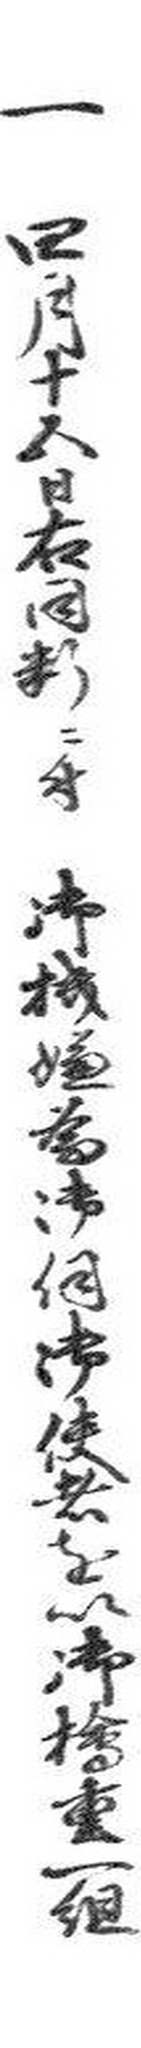一四月十五日右同断ニ付御機嫌為御伺御使者を以御檜重一組
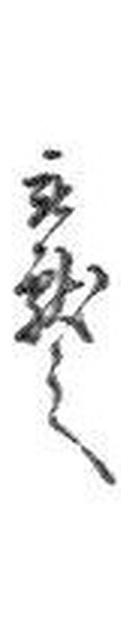被献之
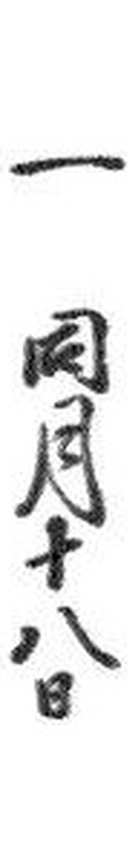一同月十八日
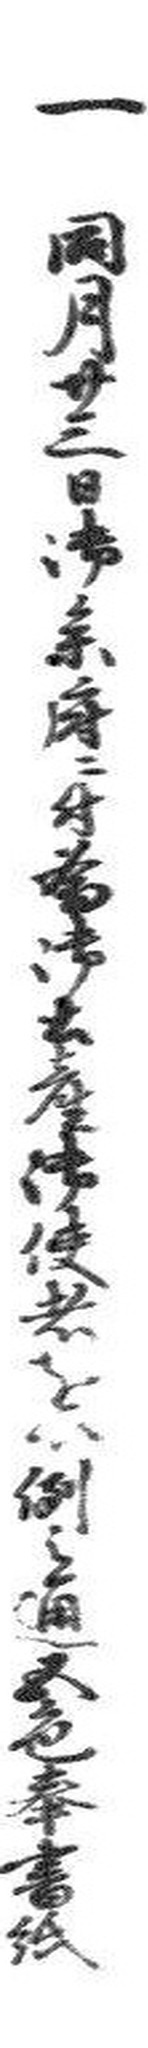一同月廿三日御参府ニ付為御土産御使者を以例之通五色奉書紙
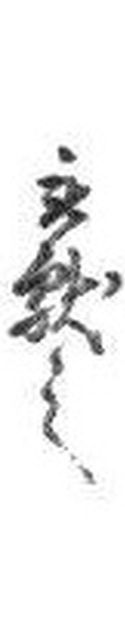被献之
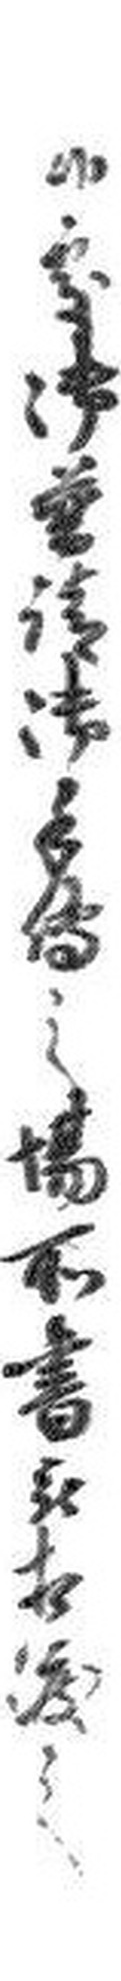候処御普請御手伝之場所書被相渡之
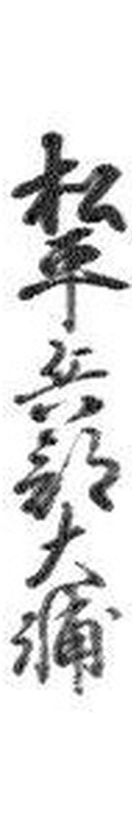松平兵部大輔

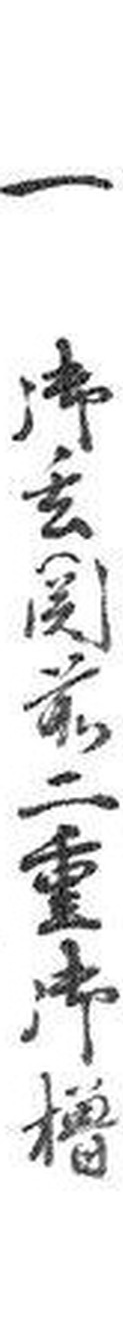一御玄関前二重御櫓
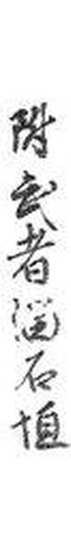附武者溜石垣
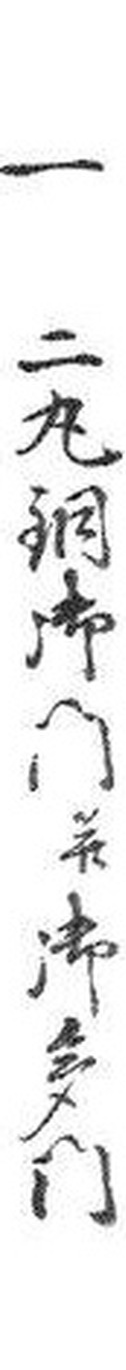一二丸銅御門并御多門
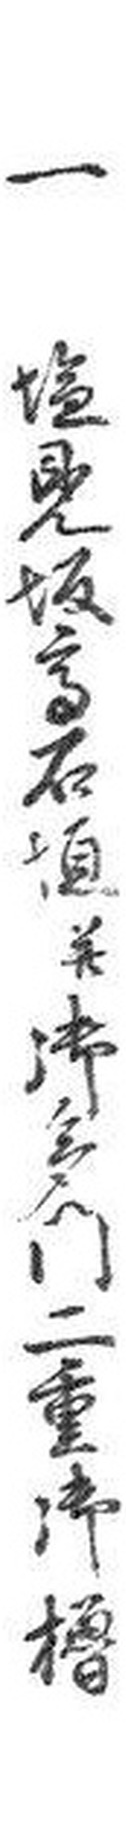一塩見坂高石垣并御多門二重御櫓
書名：家譜 二十三 吉品公 従宝永元年到同二年
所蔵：福井県文書館 Fukui Prefectural Archives
